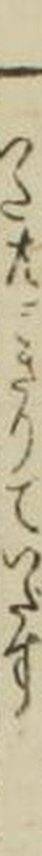いた共にきりていだす
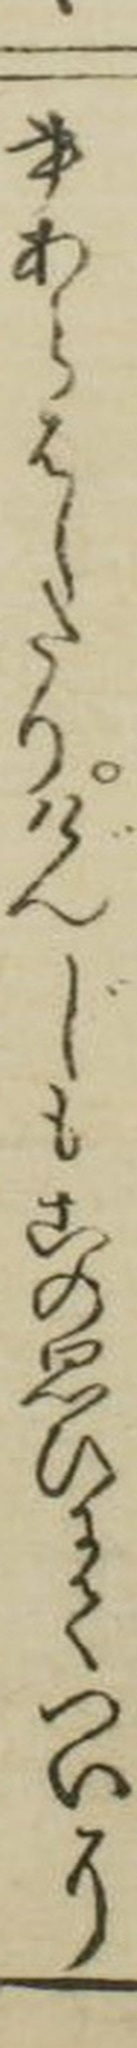書あらはしたり。げんじもこの思ひにてついに
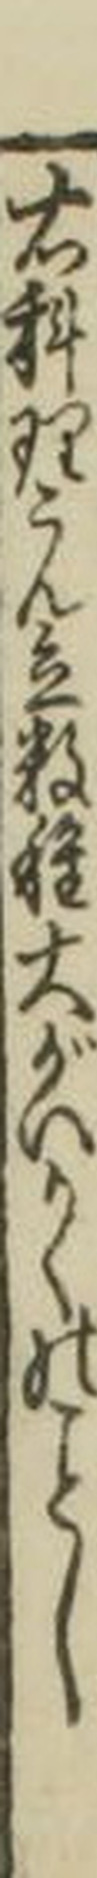右料理こん立数種大がいかくのことし
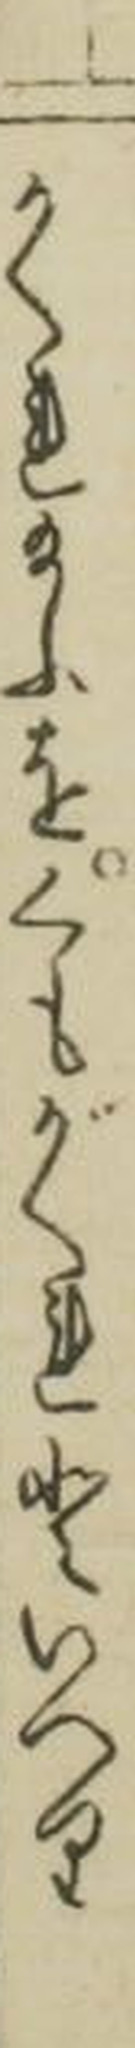かくれ給ふを。くもがくれといへり
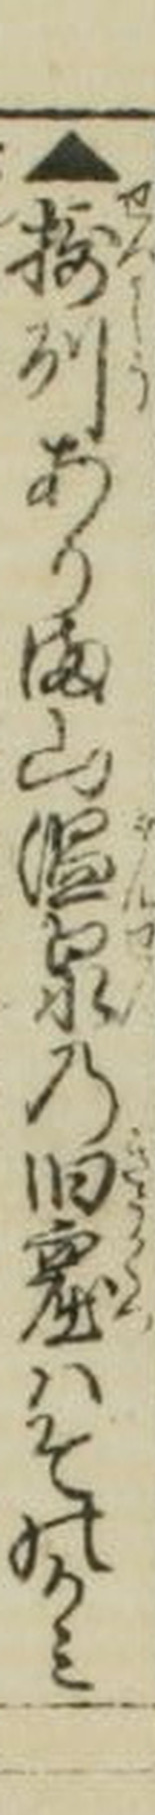▲攝州ありま山温泉の旧窟はそのかみ
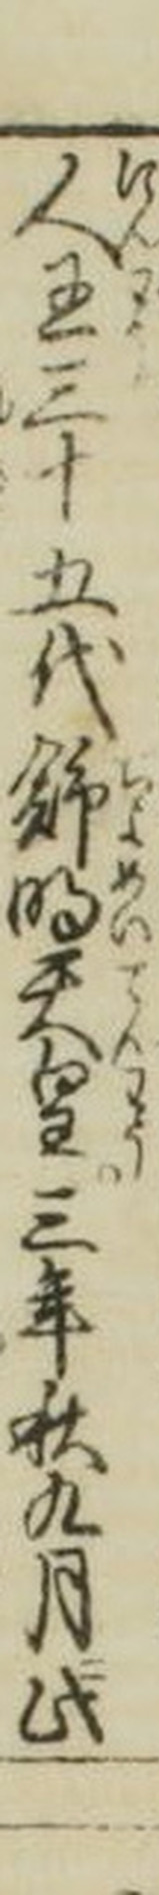人王三十五代舒明天皇。三年秋九月に此
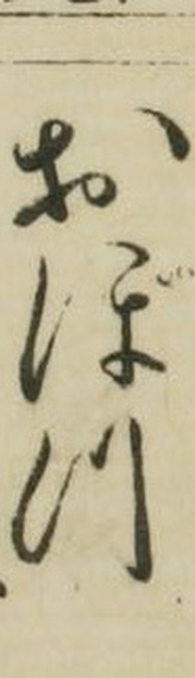おぼつ
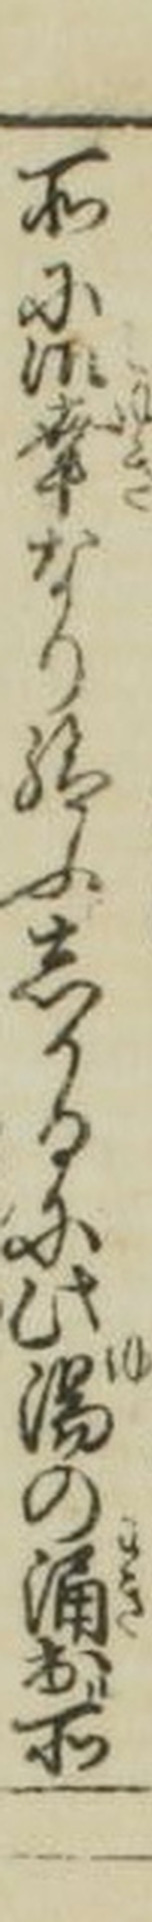所に御幸なり給ふ。しかるに此湯の涌おる所
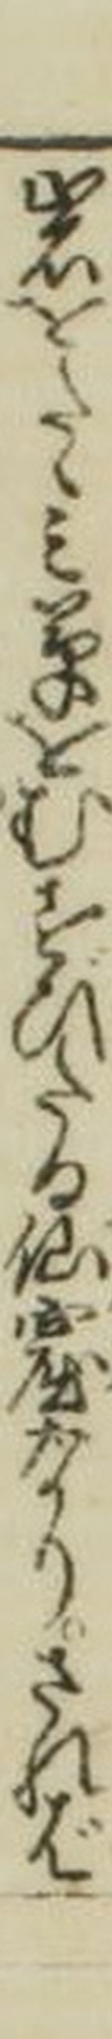岩をたゝみ草をむすびたる仙窟なり。されば
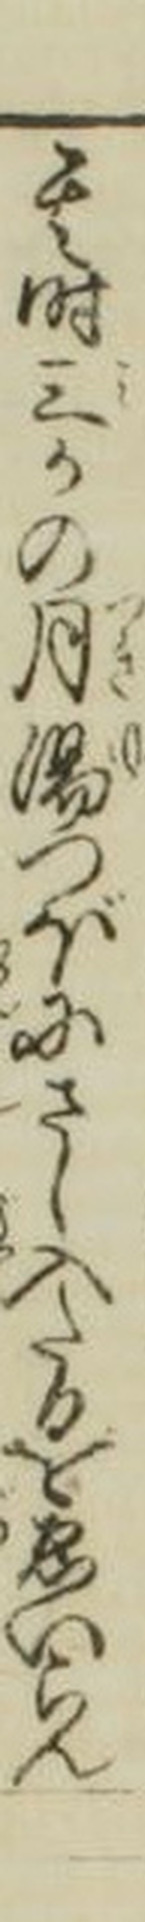其時三かの月湯つぼにさし入たるをゑいらん
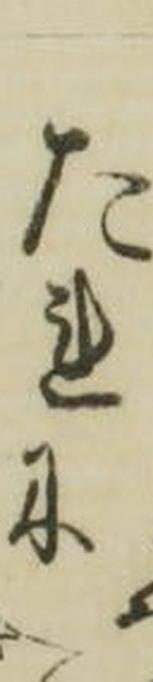たれに
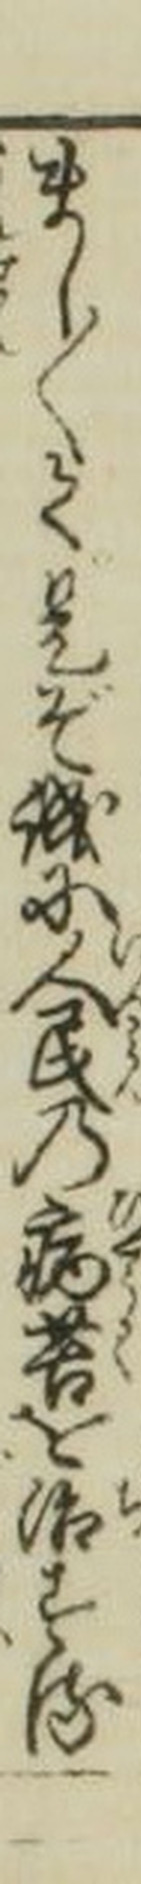まし〳〵て。是ぞ誠に人民の病苦を治する
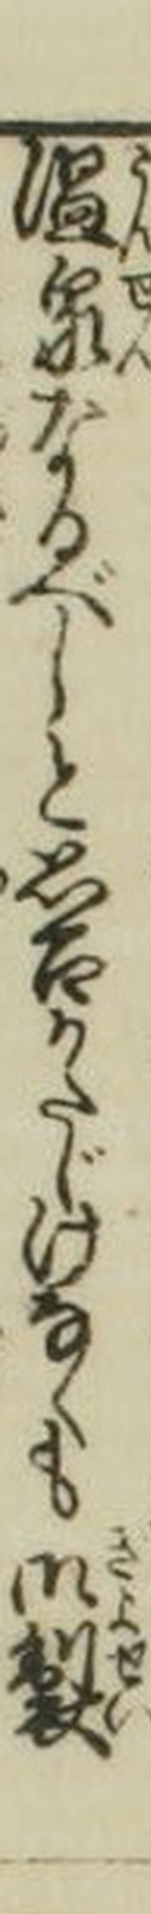温泉なるべしと思召かたじけなくも御製
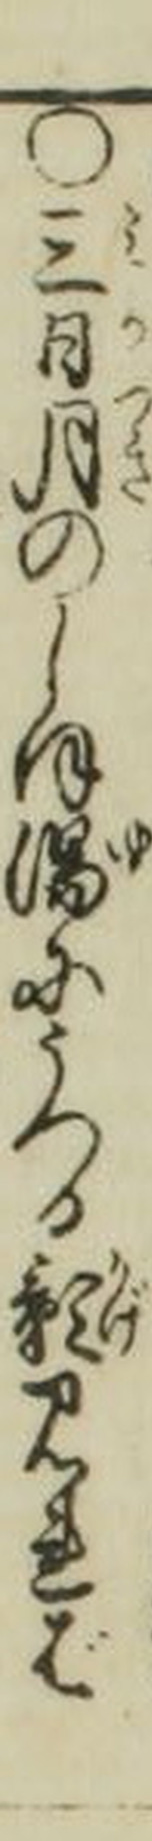◯三日月のしほ湯にうつる影見れば
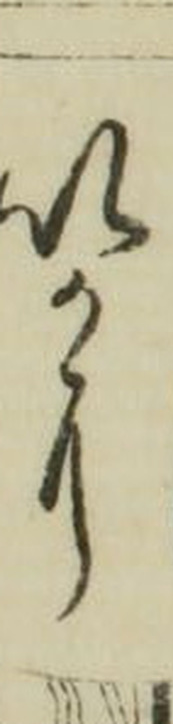いかに
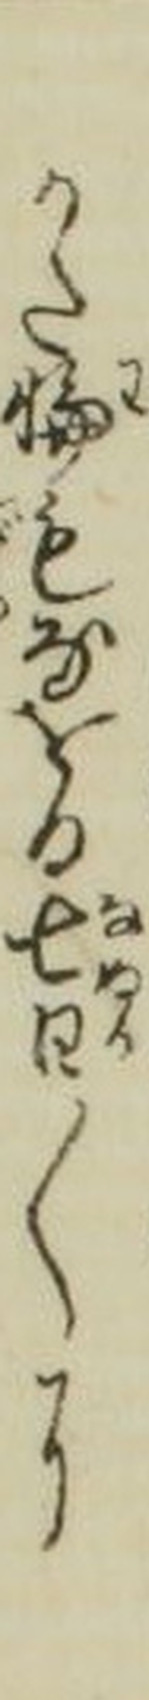かた輪もなをる七日〳〵に
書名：女源氏教訓鑑
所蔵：東京学芸大学附属図書館
